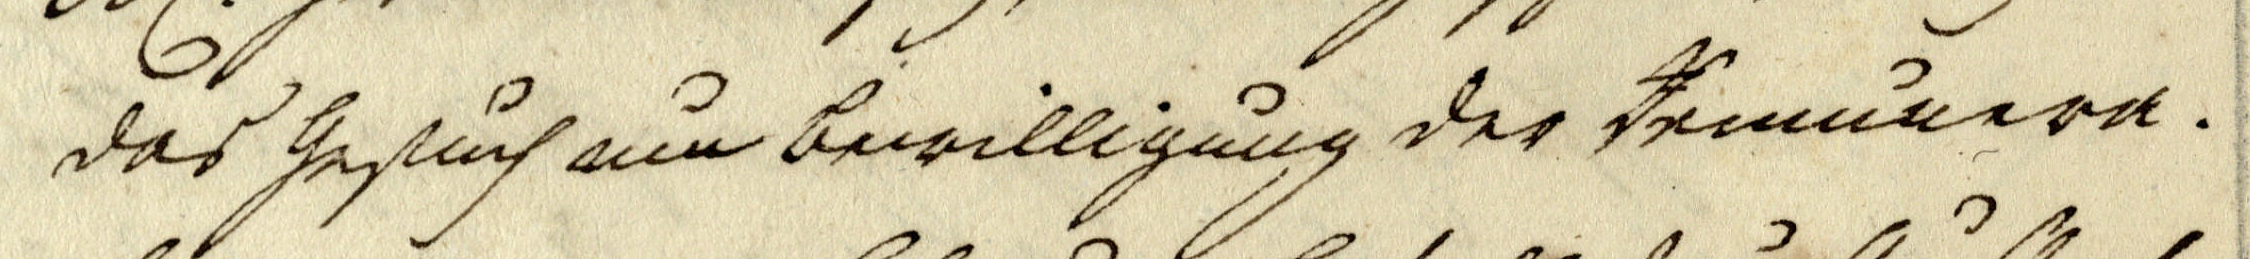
das Gesuch um Bewilligung der Remunera¬
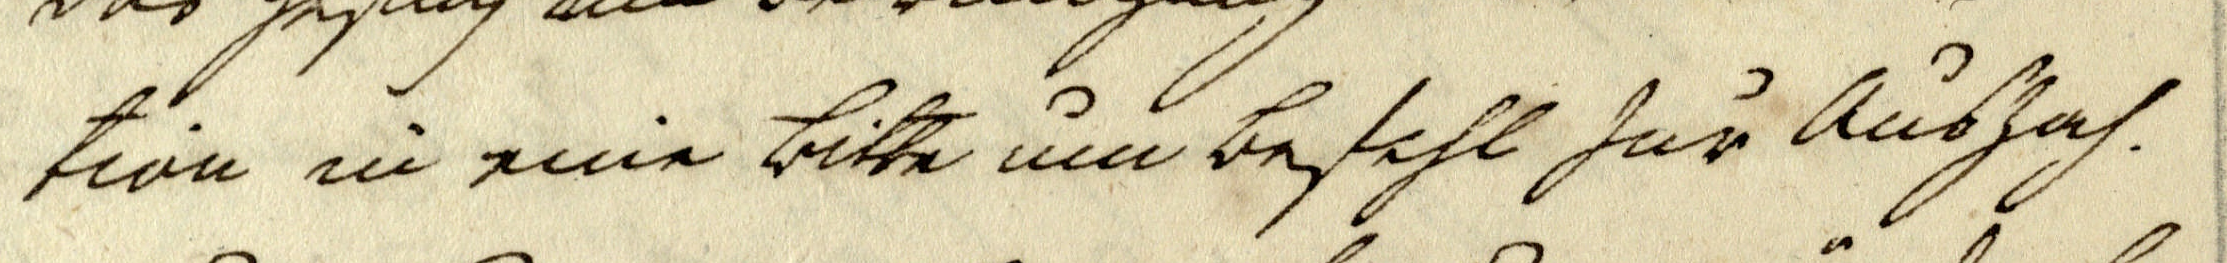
tion in eine Bitte um Befehl zur Auszah¬
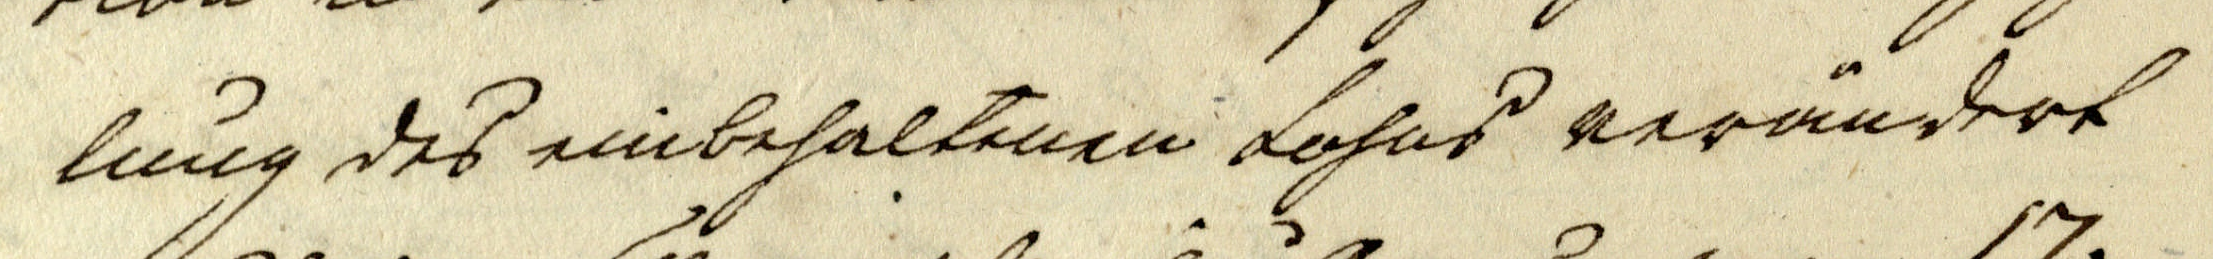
lung des einbehaltenen Lohns verändert
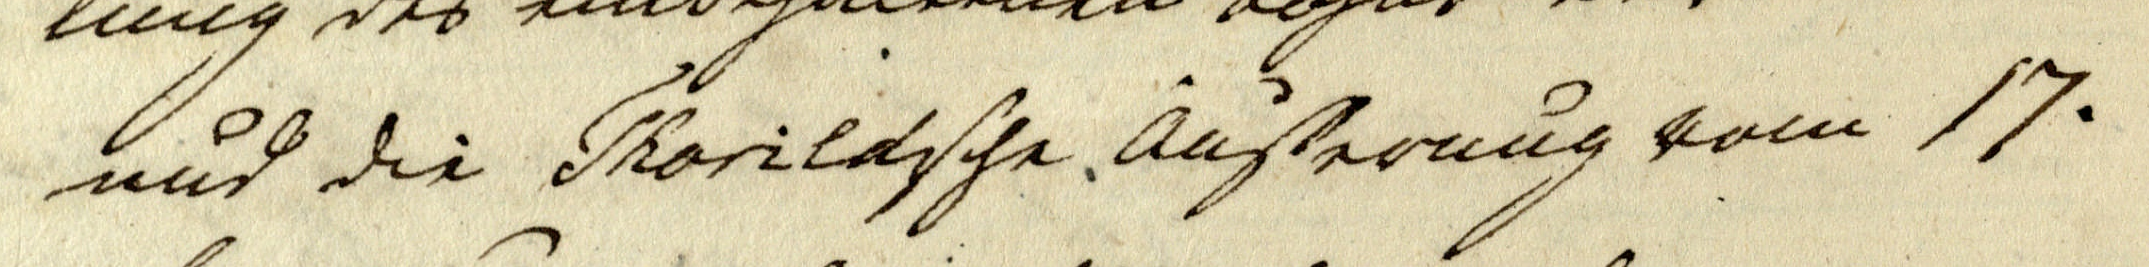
und die Thorildsche Äusserung vom 17.
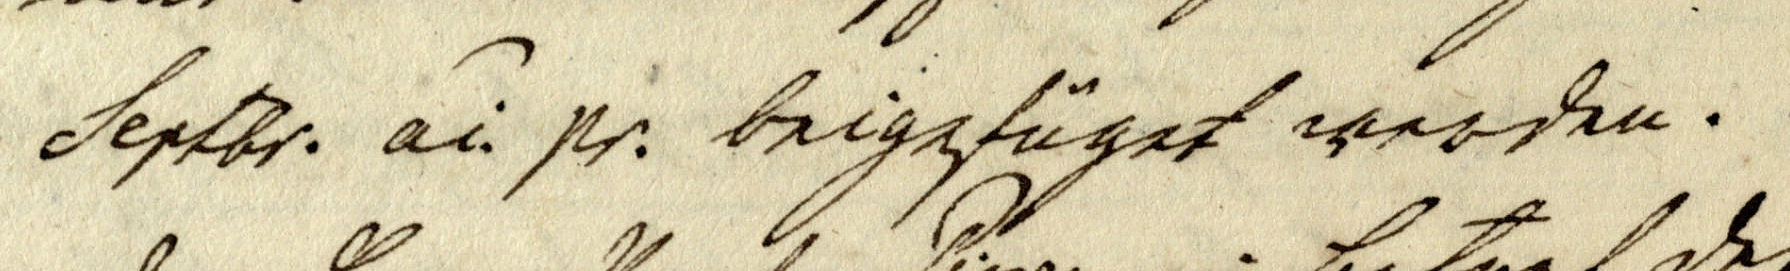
Septbr. a.i pr. beigefüget werden.
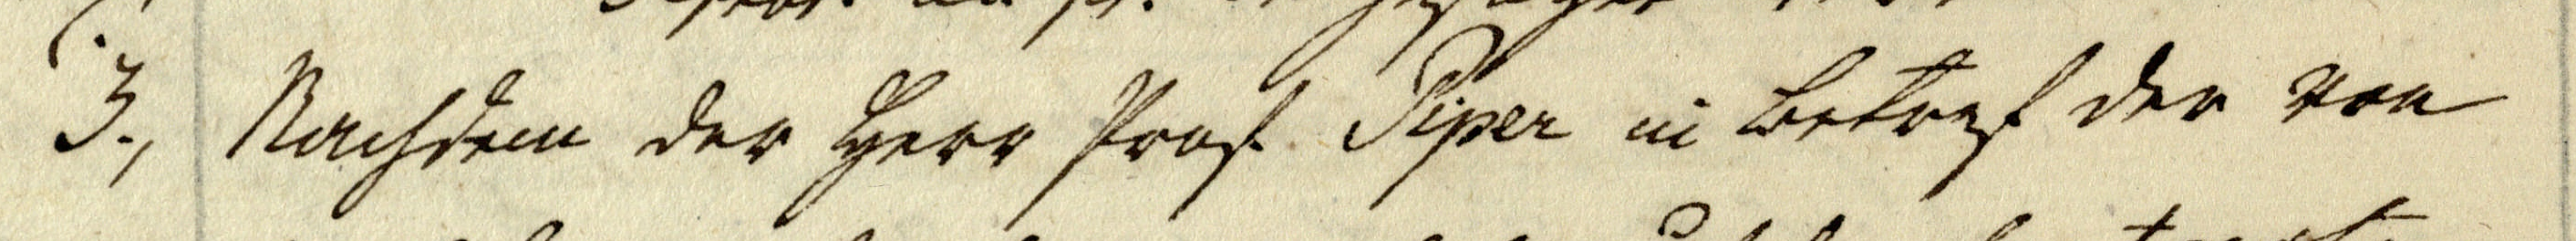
3., Nachdem der Herr Prof. Piper in Betref der von
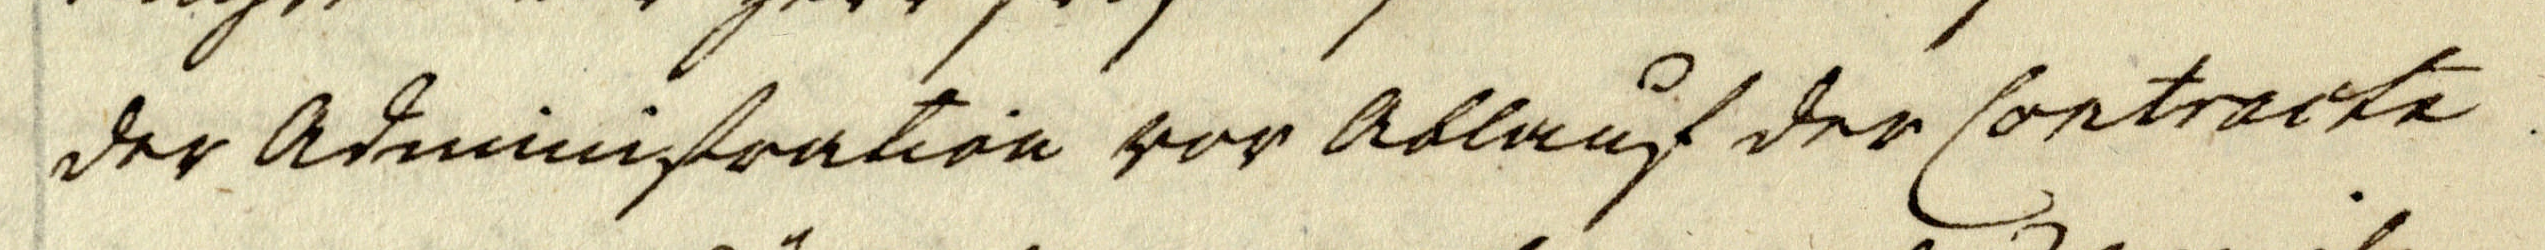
der Administration vor Ablauf der Contracte
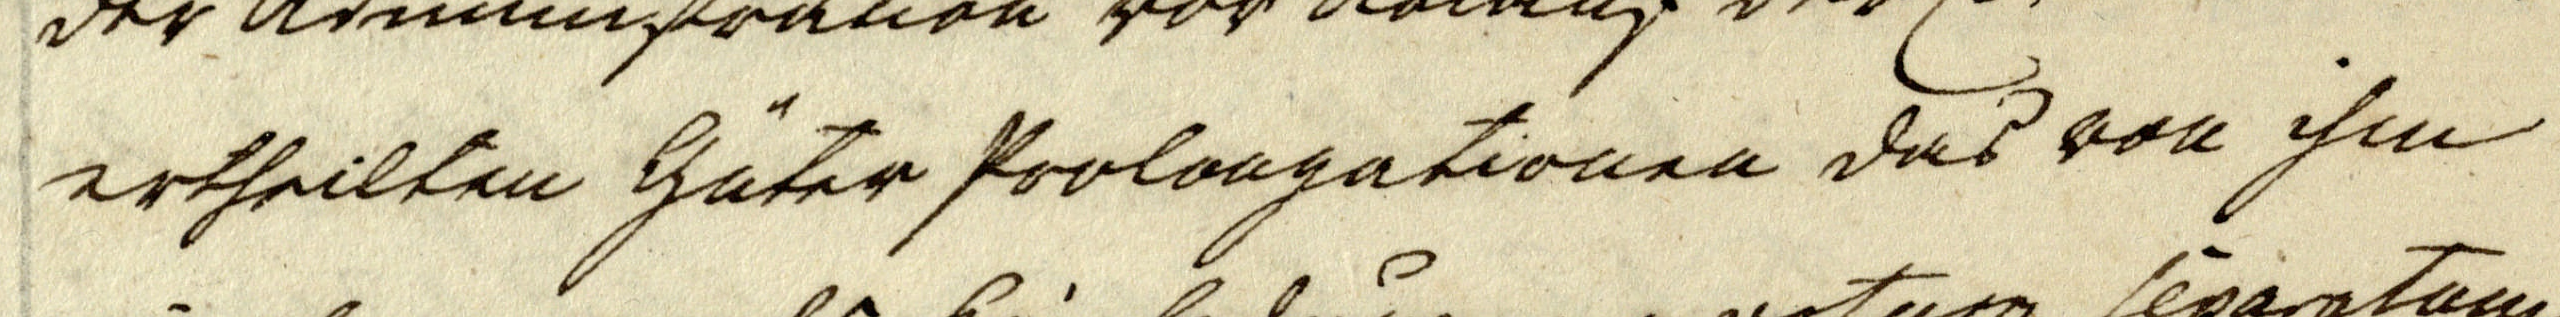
ertheilten Güter Prolongationen das von ihm
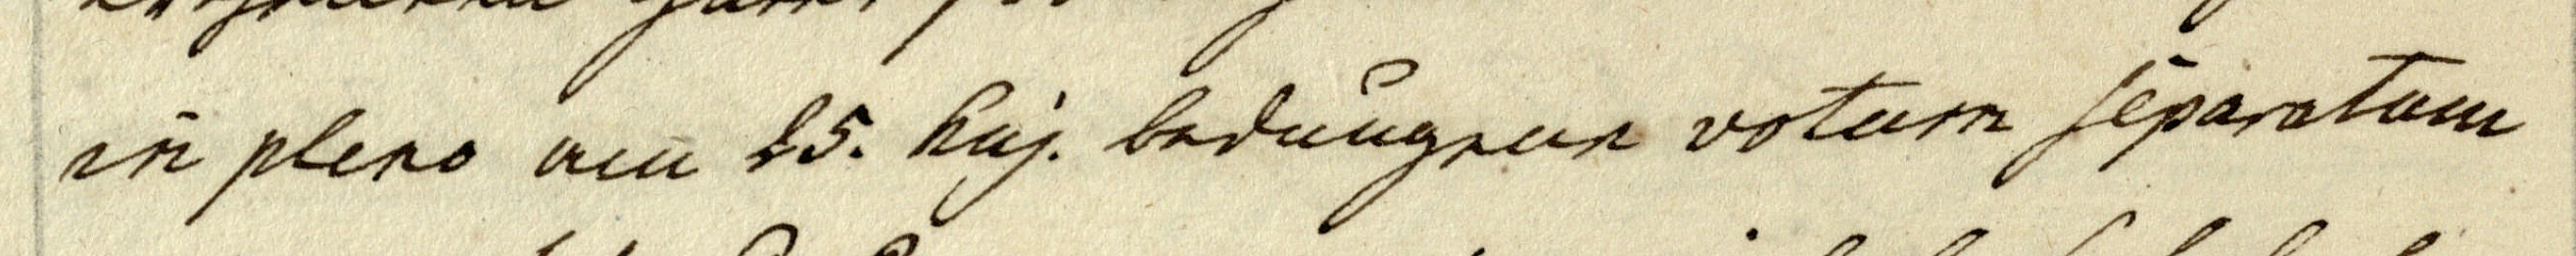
in pleno am 25. huj. bedungene votum separatum
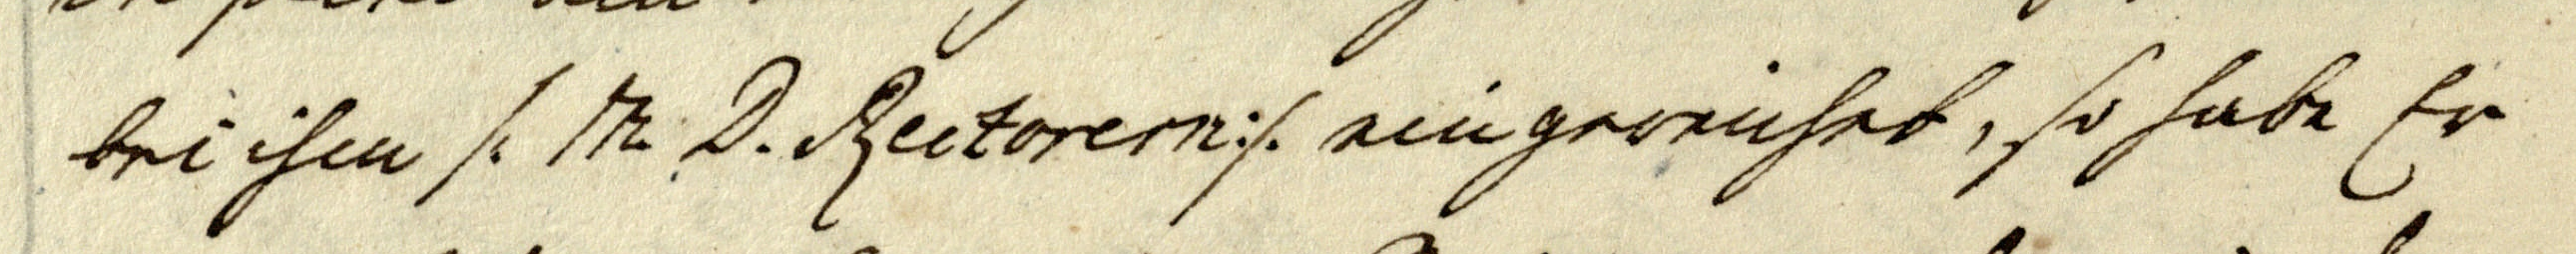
bei ihm /. M. D. Rectorem ./ eingereichet, so habe Er
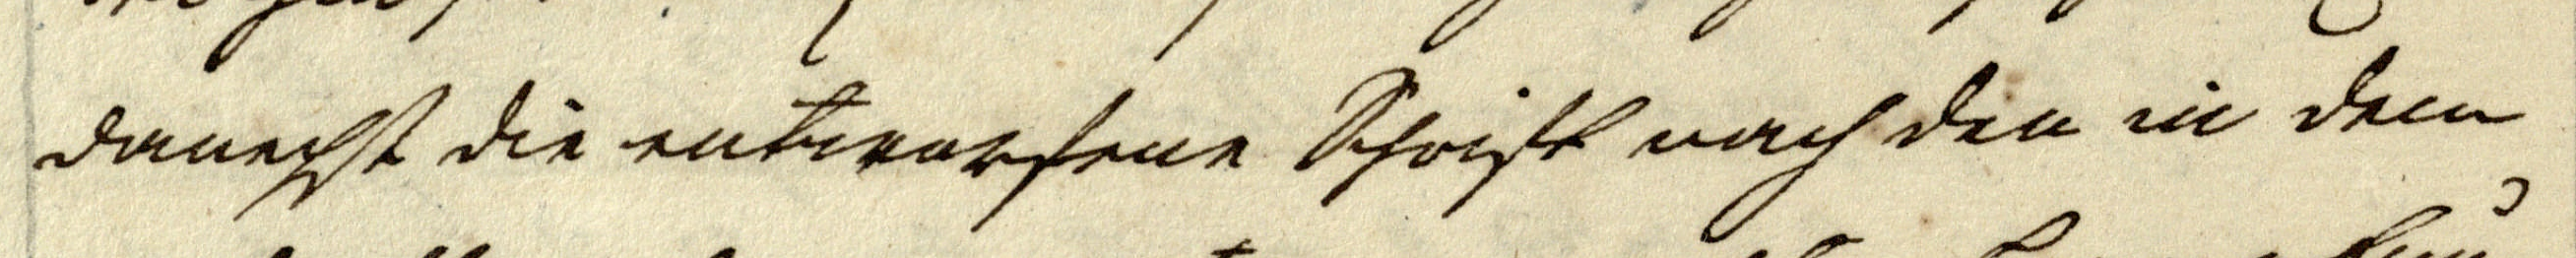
danechst die entworfene Schrift nach den in dem
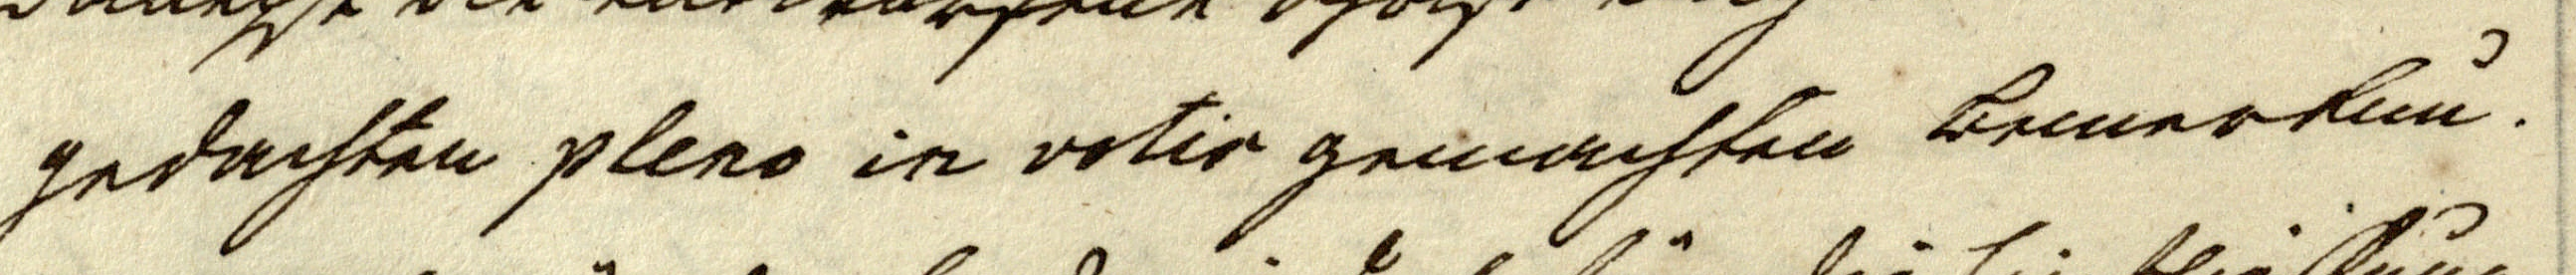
gedachten pleno in votis gemachten Bemerkun¬
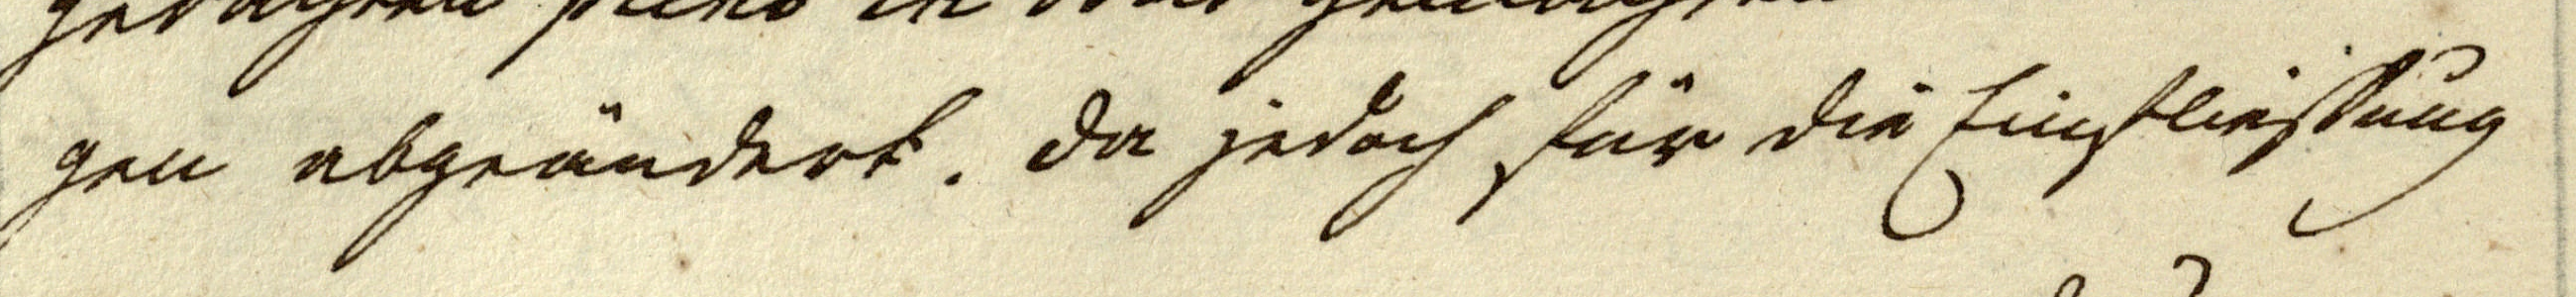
gen abgeändert. Da jedoch für die Einfliessung
